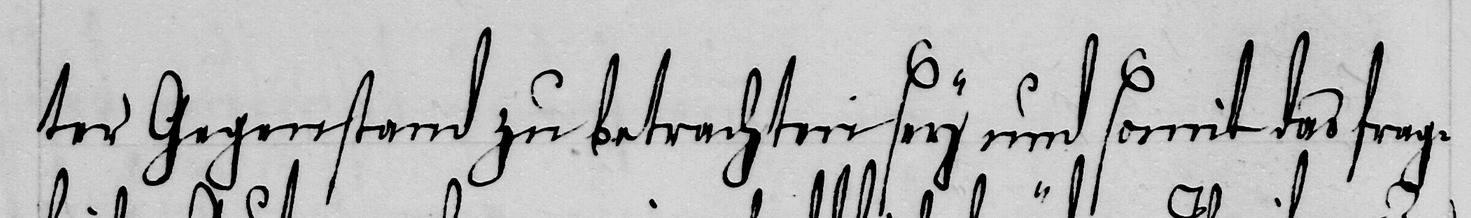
ter Gegenstand zu betrachten sey und somit das fra¬
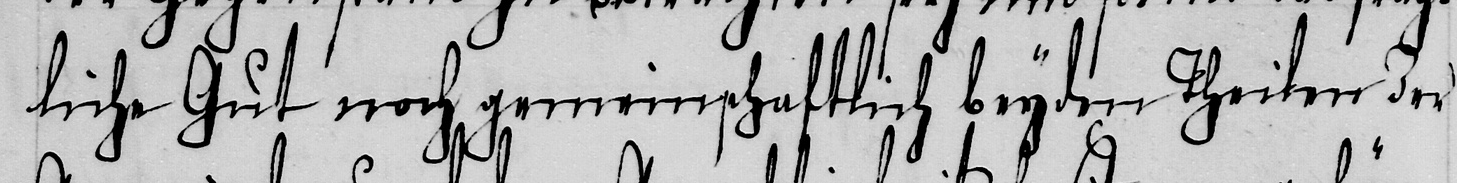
gliche Gut noch gemeinschaftlich beyden Theilen der
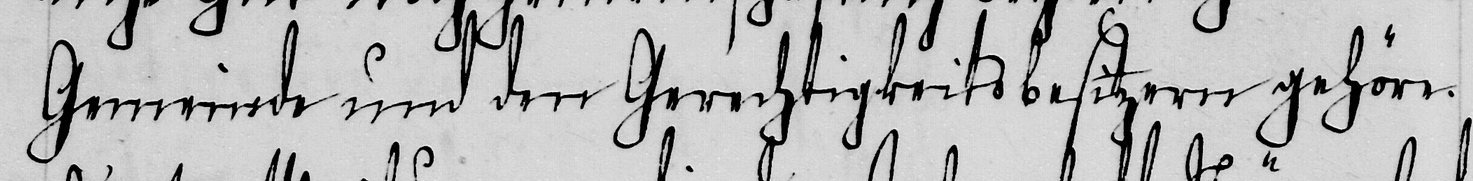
Gemeinde und den Gerechtigkeitsbesitzern gehöre.
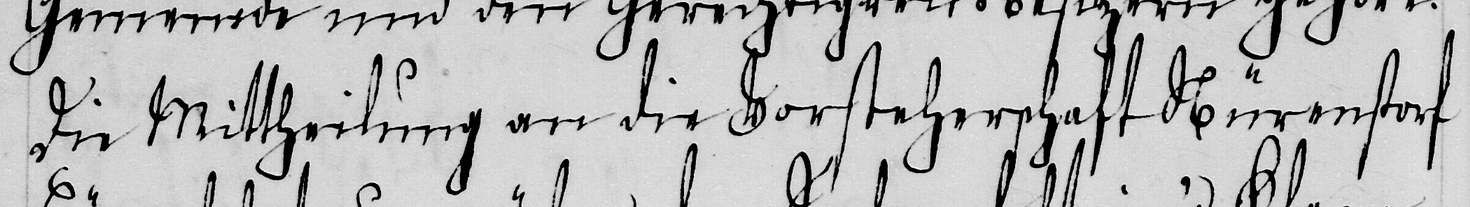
Die Mittheilung an die Vorsteherschaft Nürenstorf
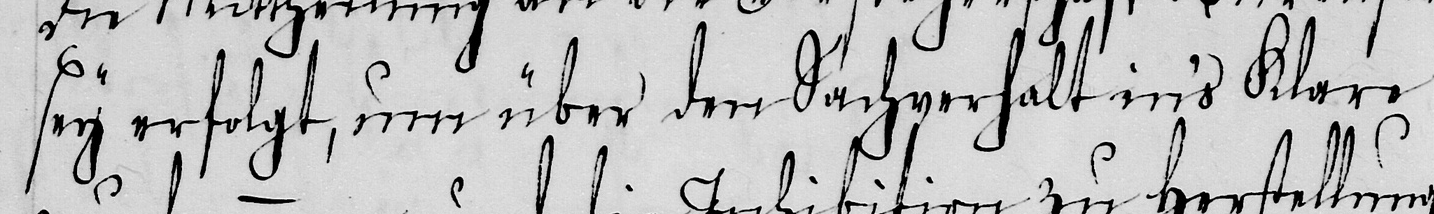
sey erfolgt, um über den Sachverhalt in’s Klare
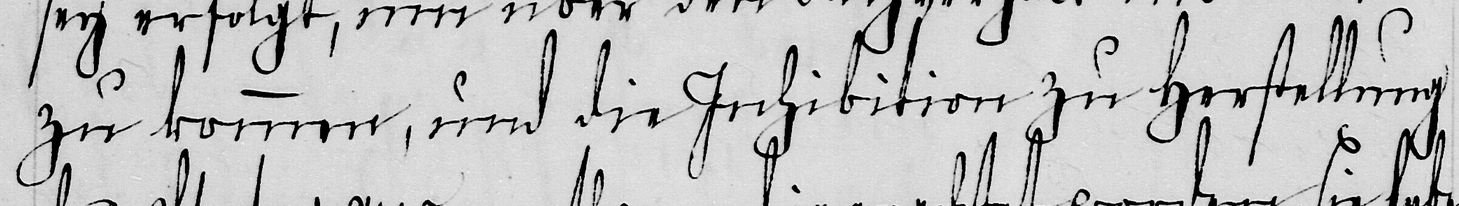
zu kommen, und die Inhibition zu Herstellung
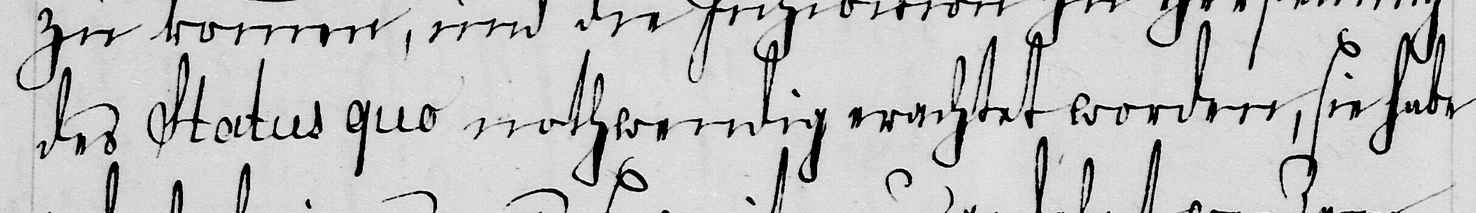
des Status quo nothwendig erachtet worden, sie habe
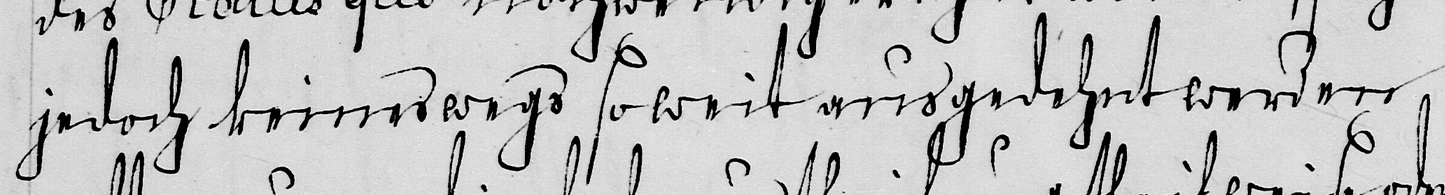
jedoch keineswegs so weit ausgedehnt werden
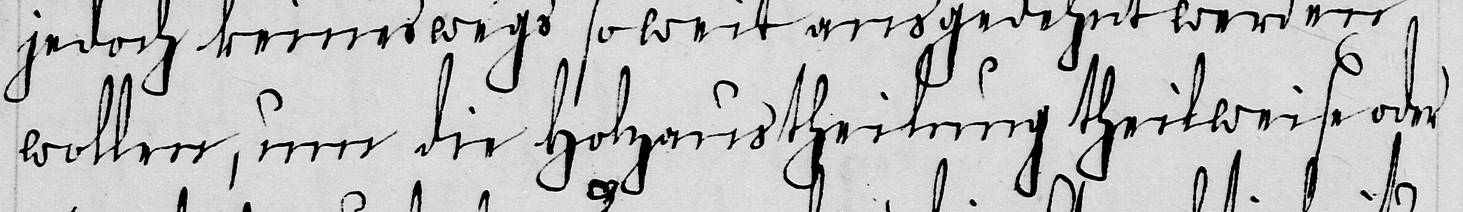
wollen, um die Holzaustheilung theilweise oder
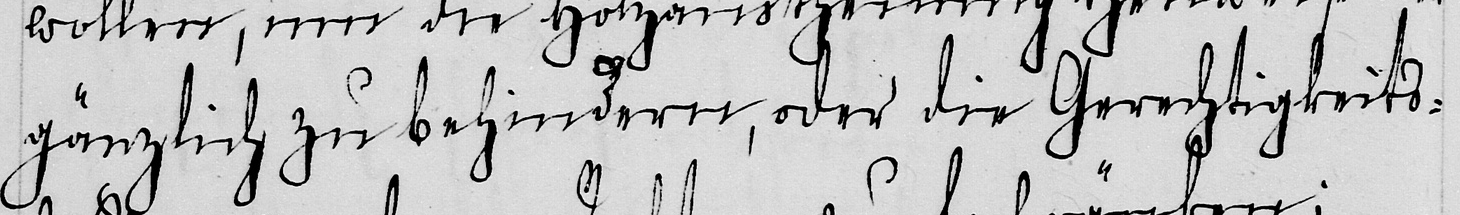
gänzlich zu behindern, oder die Gerechtigkeits¬
